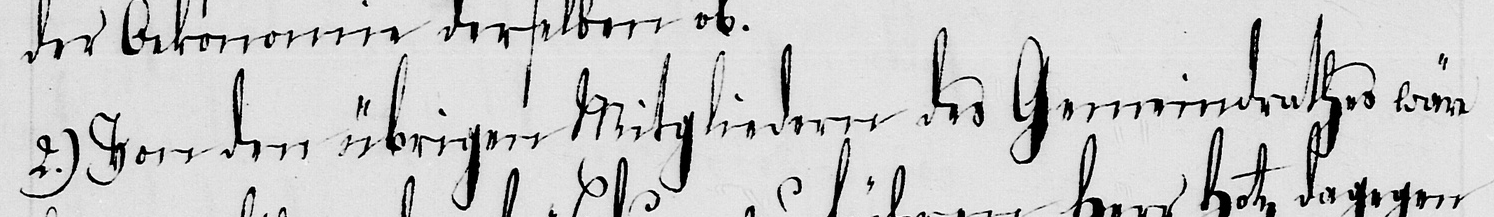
2.) Von den übrigen Mitgliedern des Gemeindrathes wäre
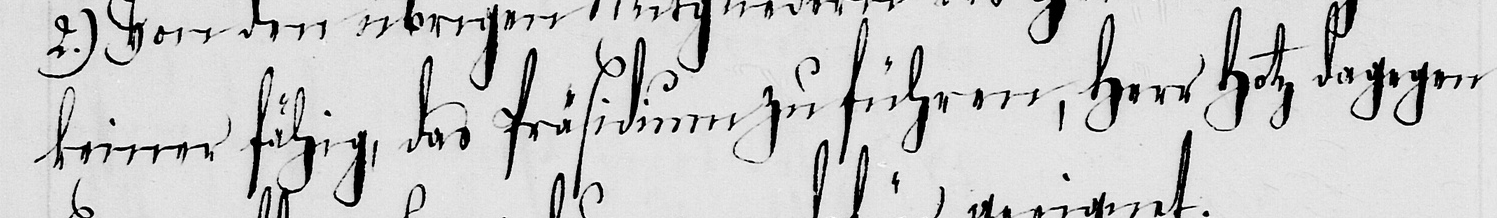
keiner fähig, das Präsidium zu führen, Herr Hotz dagegen
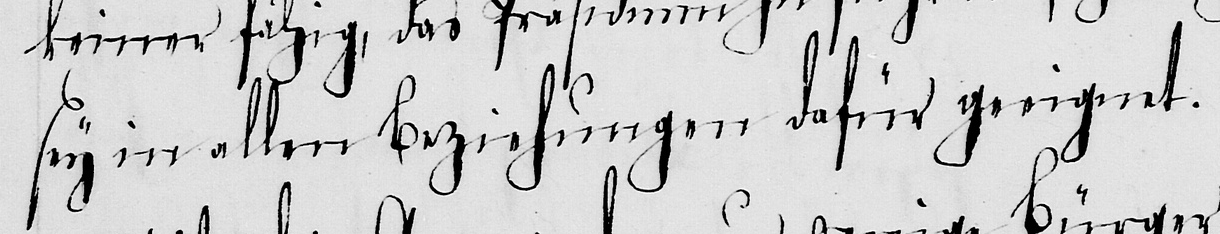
sey in allen Beziehungen dafür geeignet.
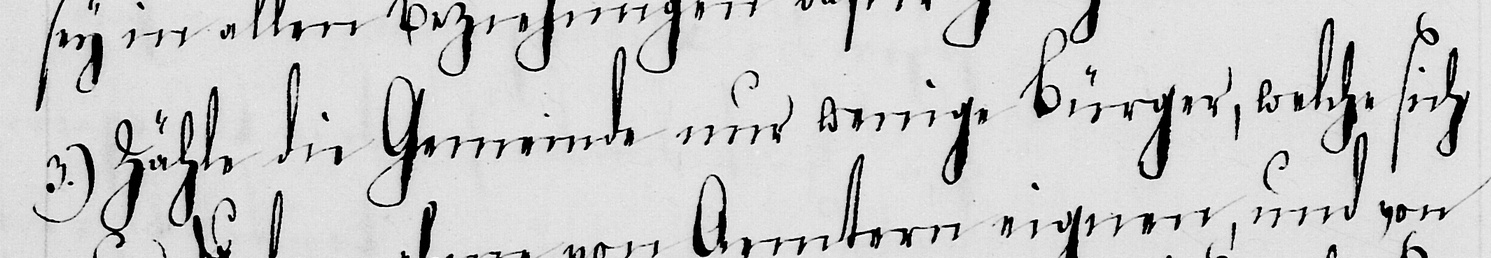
3.) Zähle die Gemeinde nur wenige Bürger, welche sich
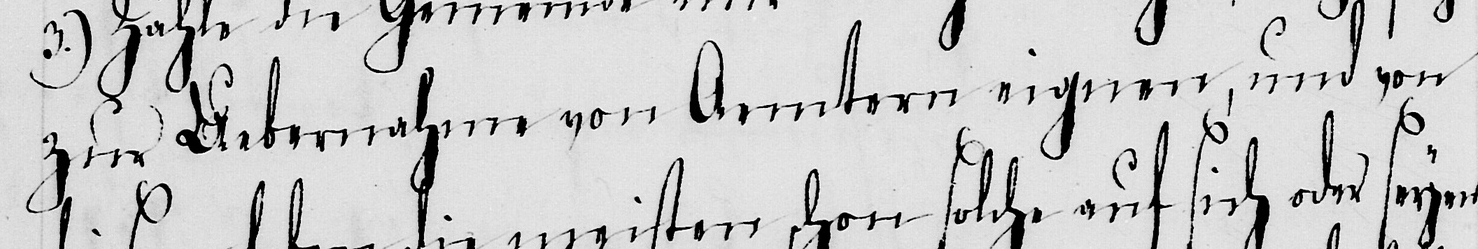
zur Uebernahme von Aemtern eignen, und von
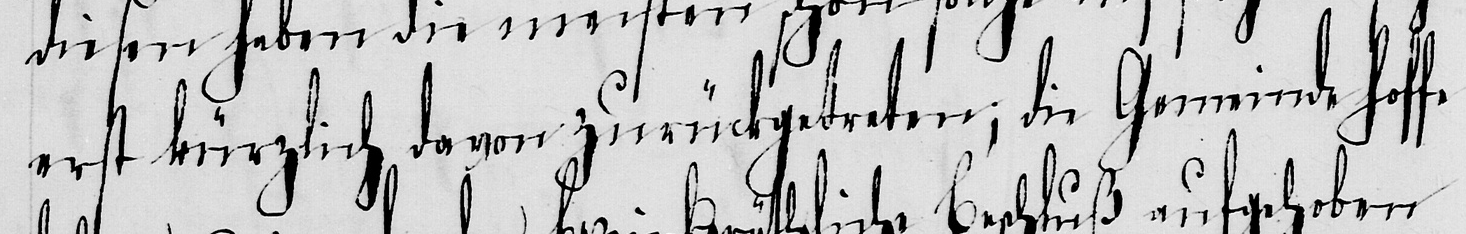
erst kürzlich davon zurückgetreten; die Gemeinde hof¬
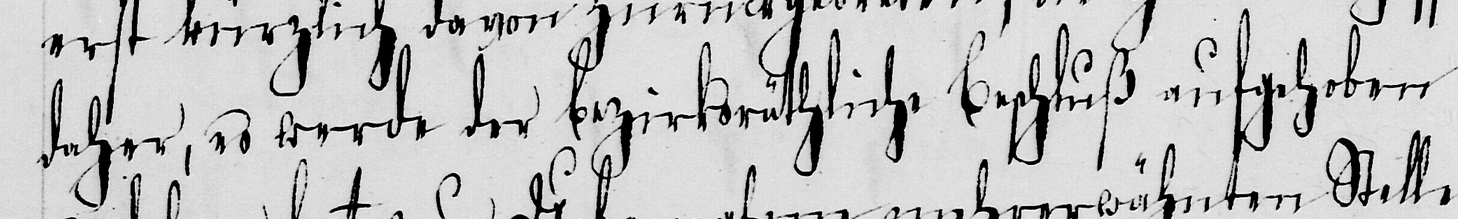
daher, es werde der bezirksräthliche Beschluß aufgehoben
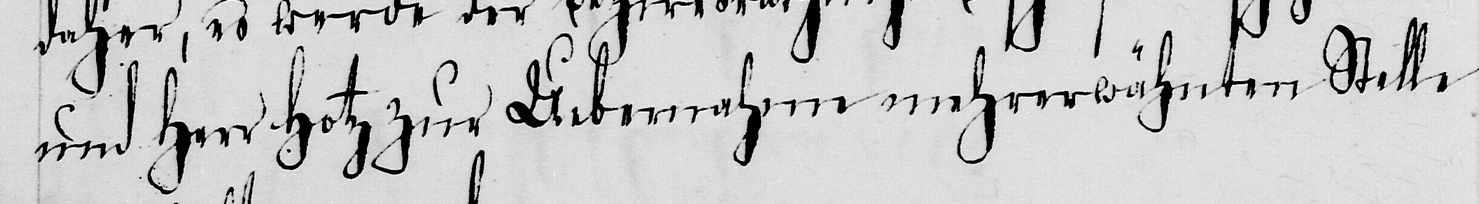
und Herr Hotz zur Uebernahme mehrerwähnten Stelle
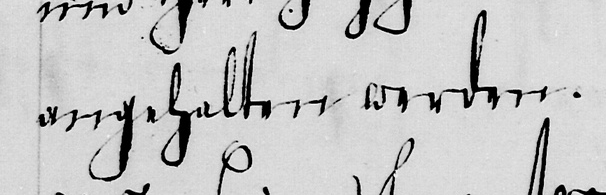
angehalten werden.
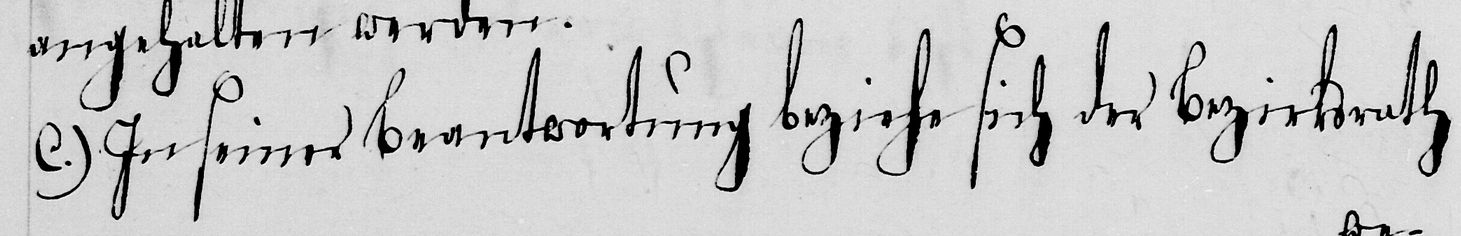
C.) In seiner Beantwortung beziehe sich der Bezirksrath
